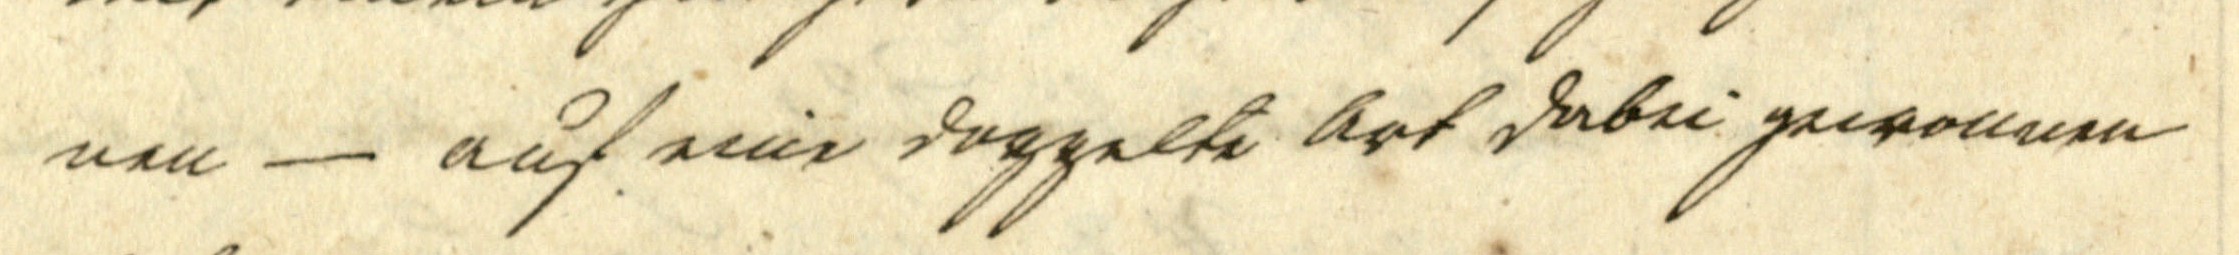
nen - auf eine doppelte Art dabei gewonnen
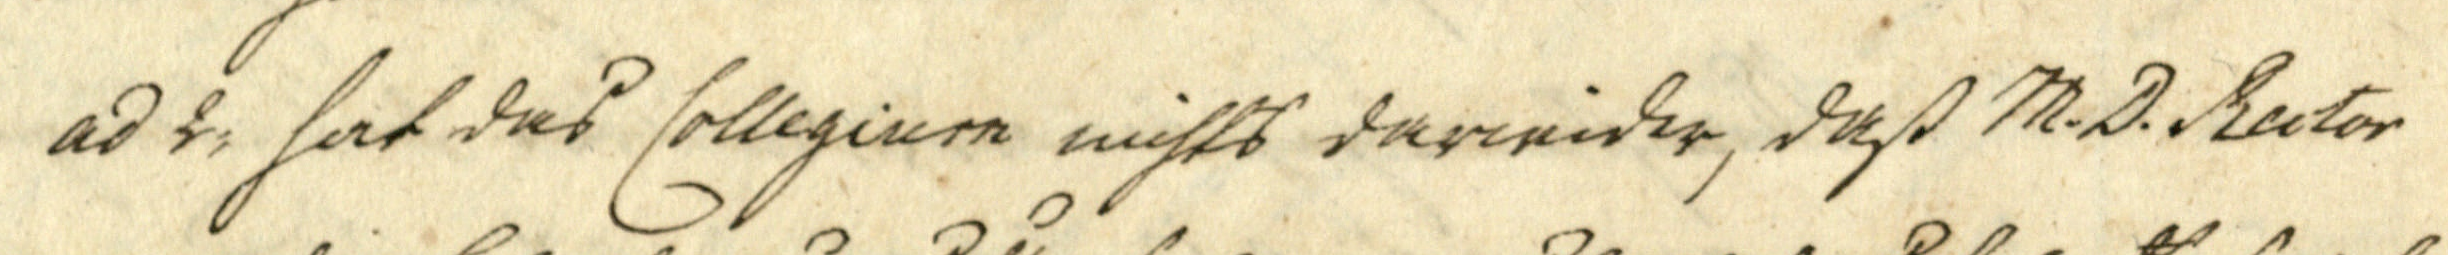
ad 2. hat das Collegium nichts darwider, daß M. D. Rector
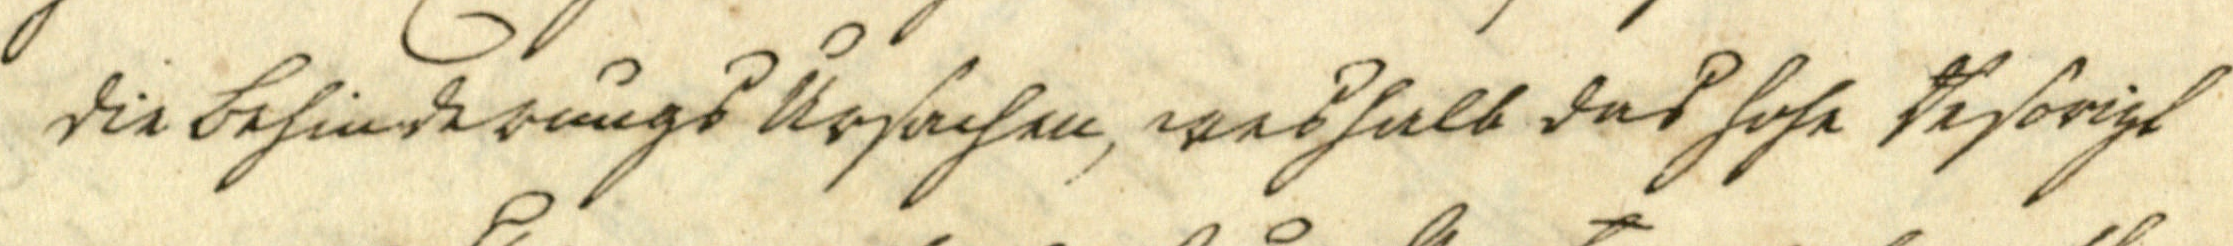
die Behinderungs Ursachen, weshalb das hohe Rescript
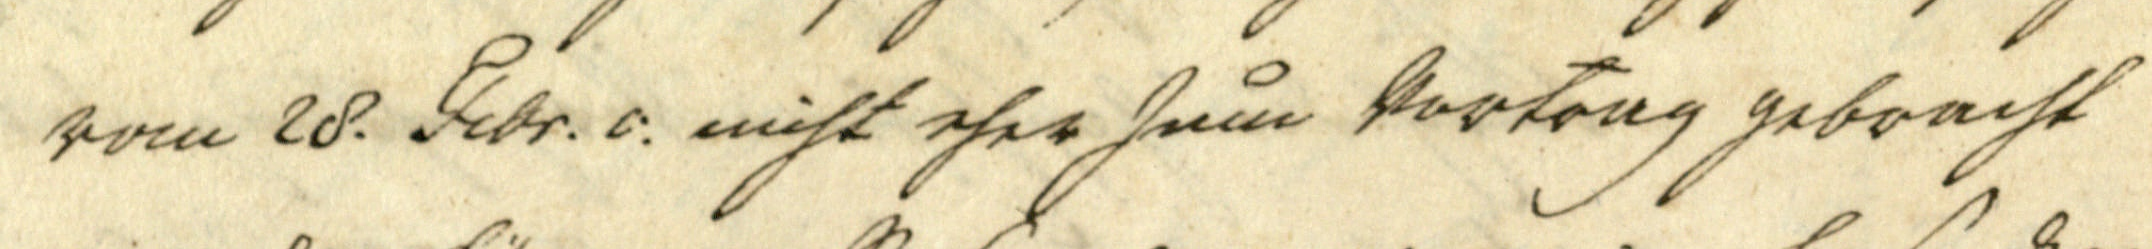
vom 28. Febr. c. nicht eher zum Vortrag gebracht
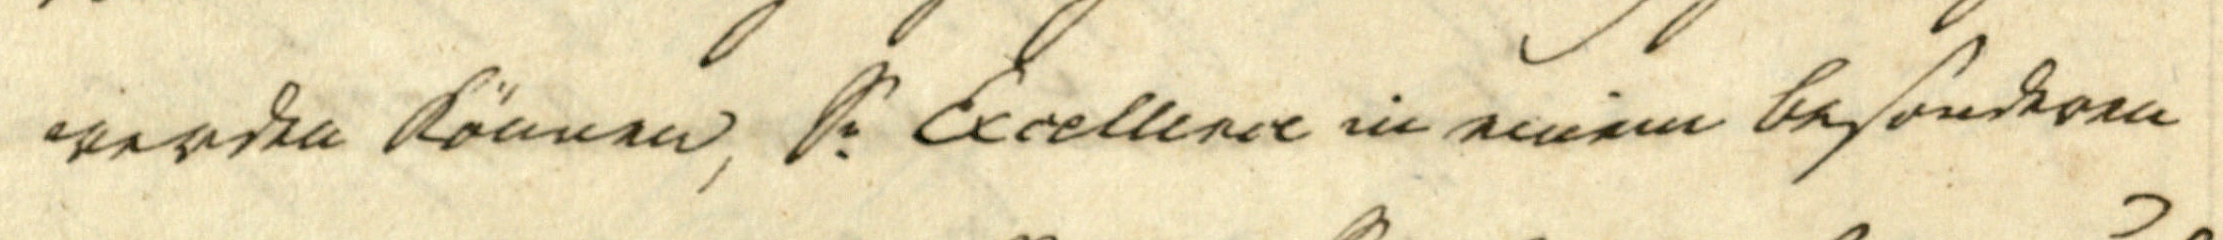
werden können, Sr Excellence in einem besonderen
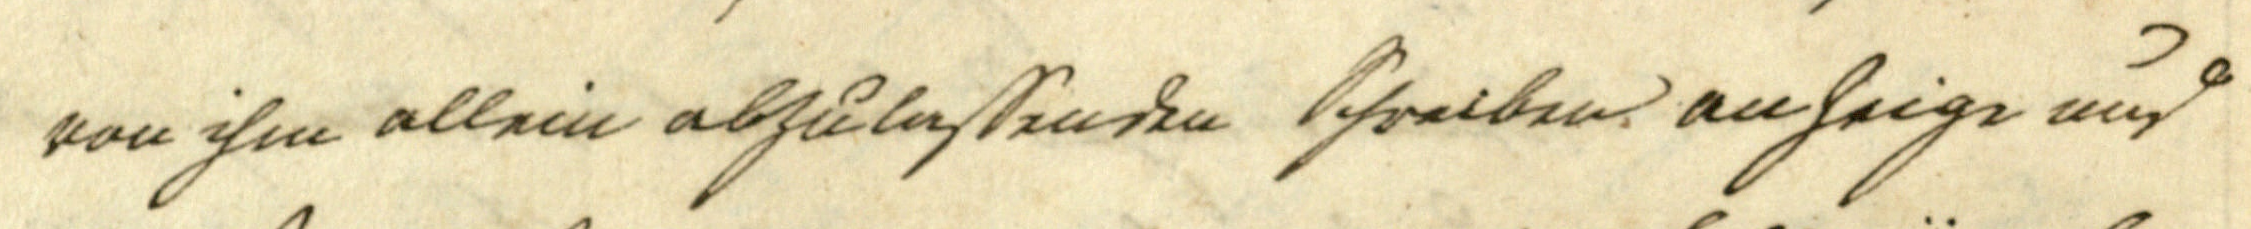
von ihm allein abzulassenden Schreiben anzeige und
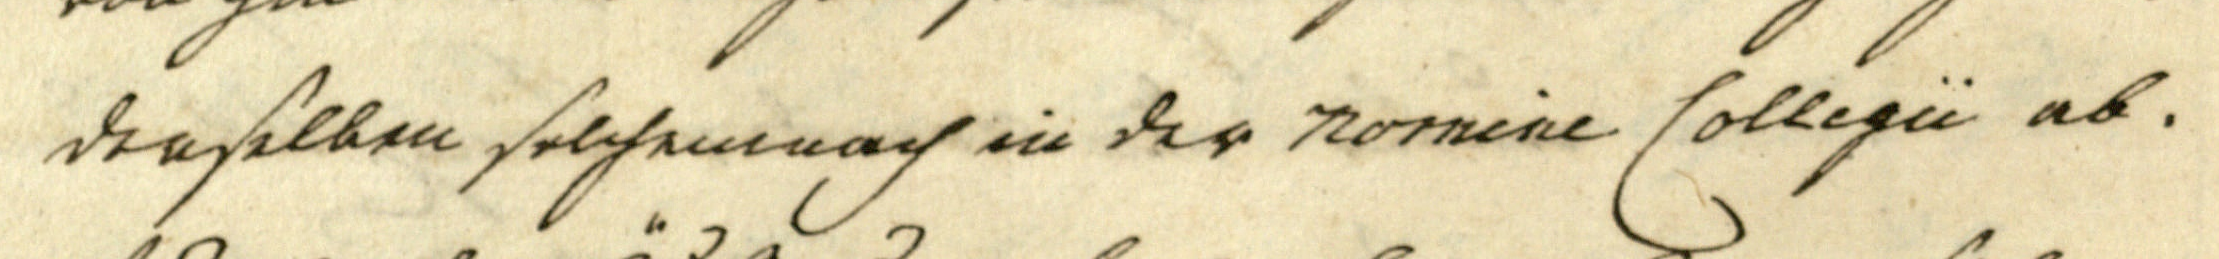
derselben solchemnach in der nomine Collegii ab¬
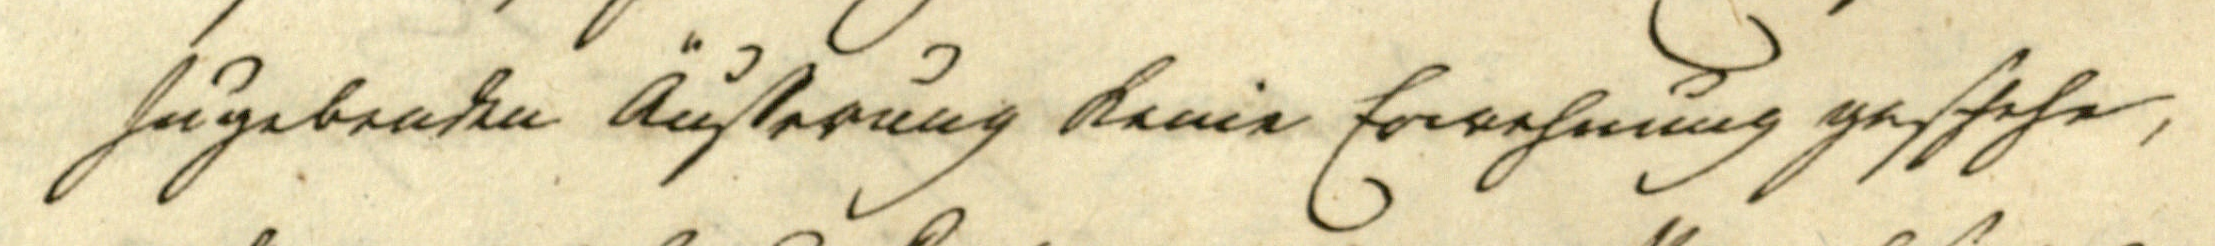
zugebenden Äusserung keine Erwehnung geschehe,
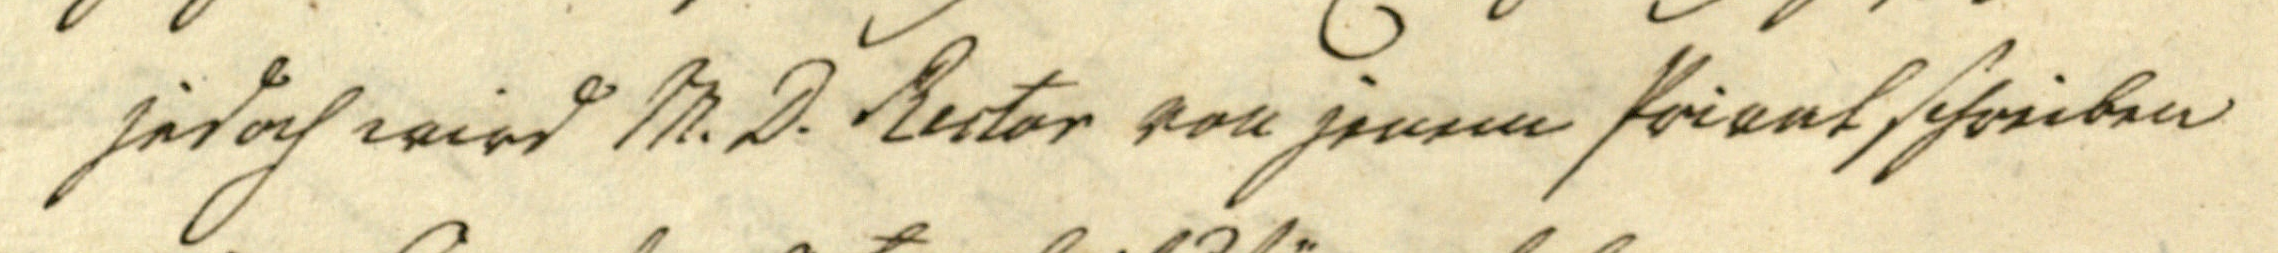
jedoch wird M. D. Rector von jenem Privatschreiben
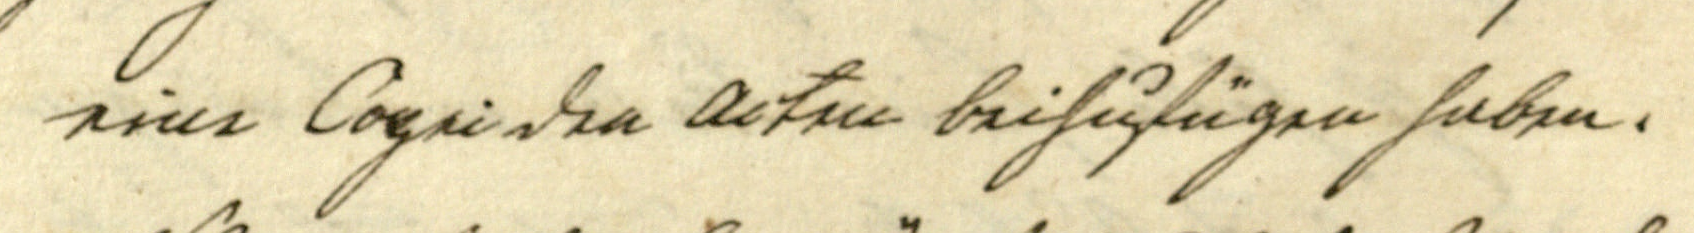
eine Copei den Acten beizufügen haben.
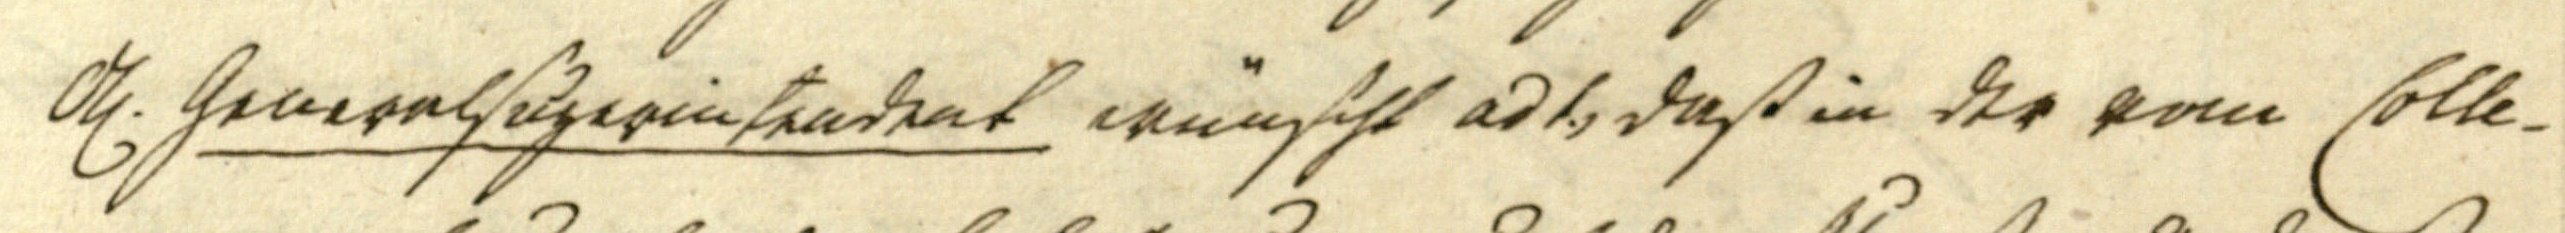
dh. Generalsuperintendent wünscht ad 1, daß in der vom Colle¬
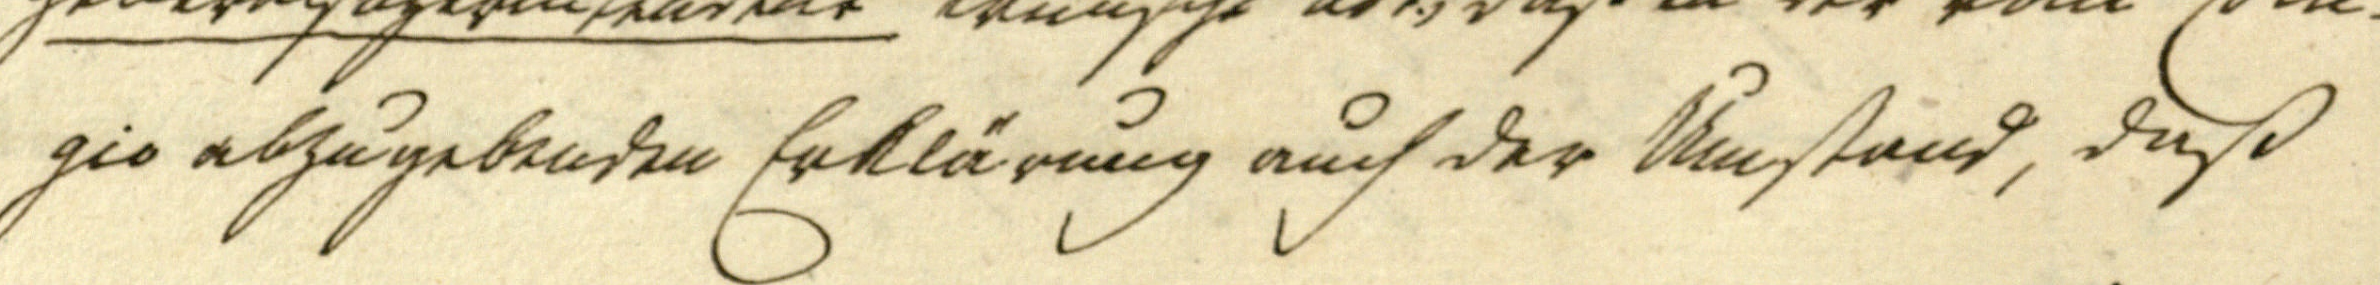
gio abzugebenden Erklärung auch der Umstand, daß
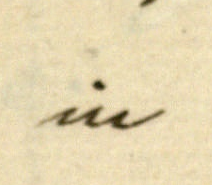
in
